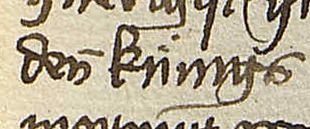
des künigs
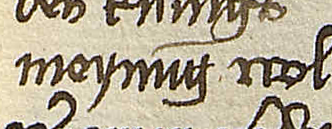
meynu*g wol
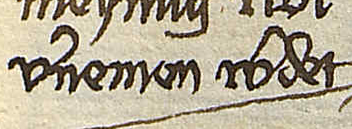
v*nemen w*det
